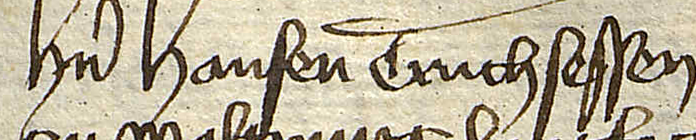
hn* hanſen Truchſeſſen
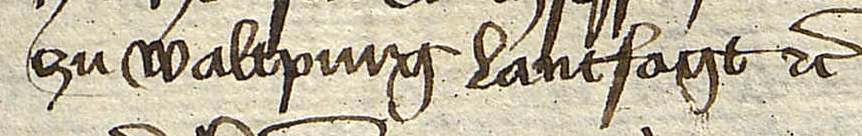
cʒu waltpurg lantfogt ec*
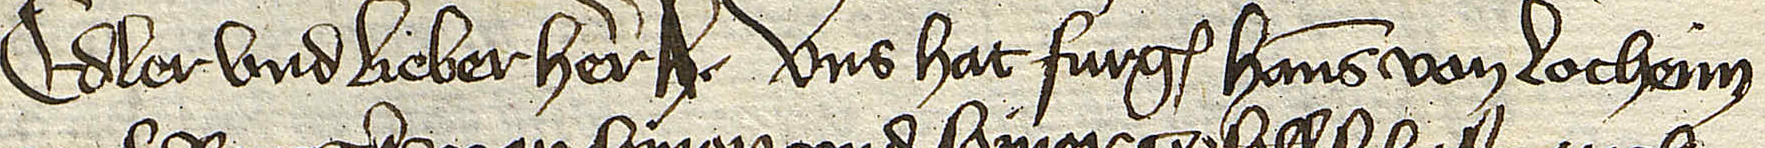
Edler vnd Lieber her* h / Vns hat fürg* han*s von locheim
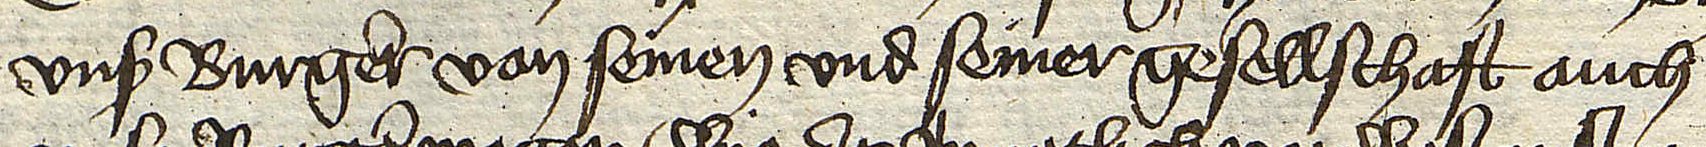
vnſ* Burger von ſeinen vnd ſeiner geſellſchaft auch
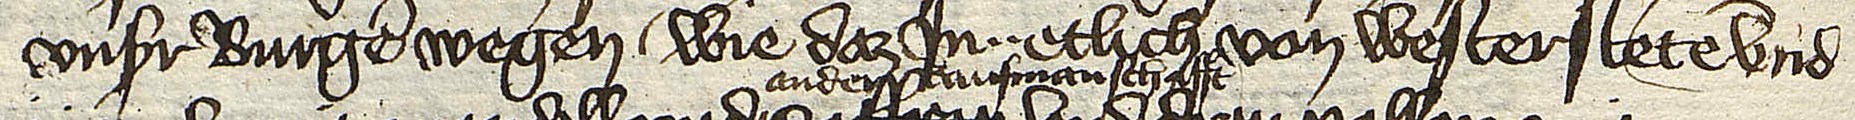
vnſ*r Burge* wegen / wie daʒ In ~ etlich von weſterſtete* vnd
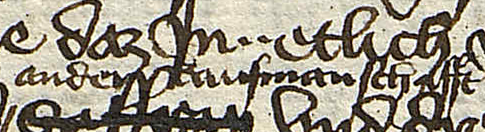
ander kaufmanſchafft
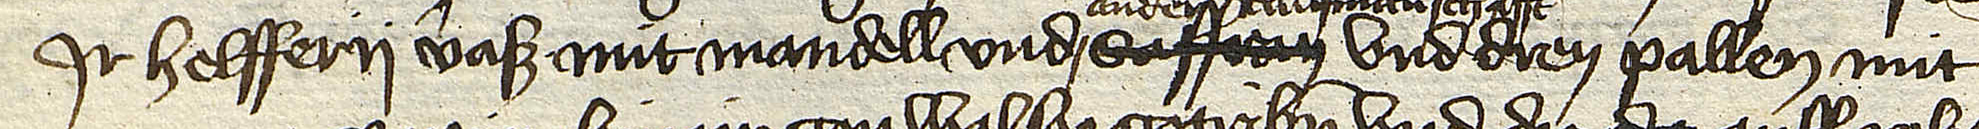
Ir helffer ii vaſʒ mit mandell vnd Saffran vnd drey pallen mit
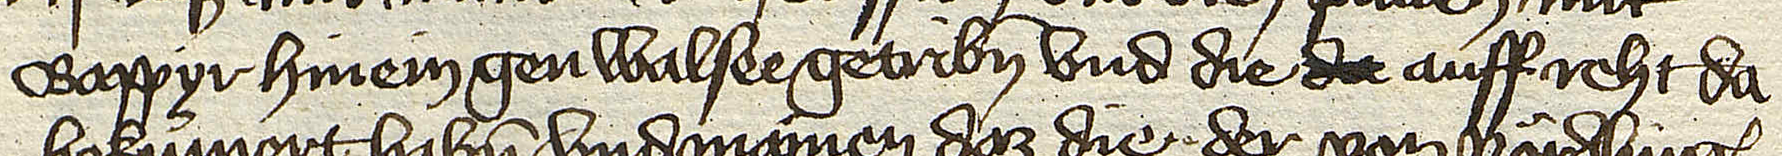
Bappyr hinein gen walſee getribn* vnd die da auff reht da
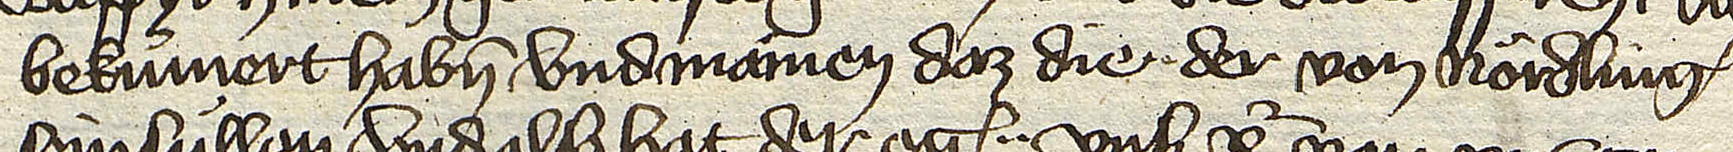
bekümert habn* / vnd mainen daʒ die ~ der von Nördling*
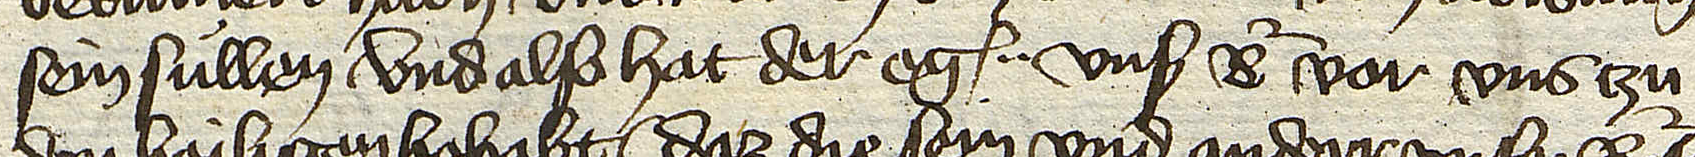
ſein ſüllen / vnd alſo hat der eg* ~ vnſ* B* vor vns cʒu
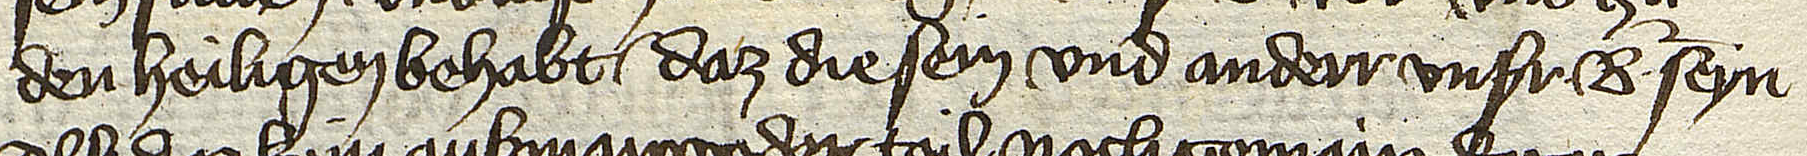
den heiligen behabt / daʒ die ſein vnd anderr vnſ*r B* ſeyn
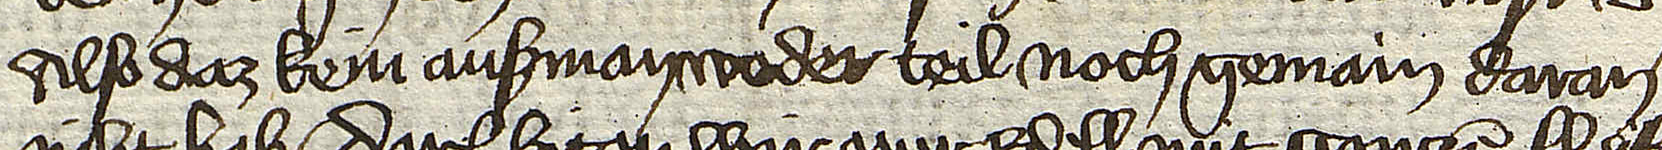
Alſo daʒ kein auſʒman weder teil noch gemain daran
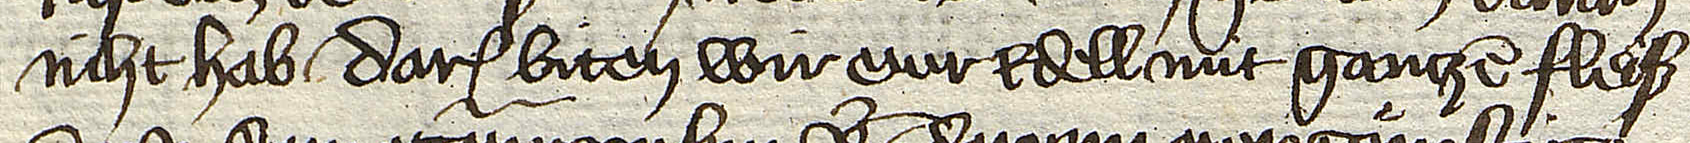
niht hab / Dar* biten wir ewr Edell mit gancʒe* fleiſʒ
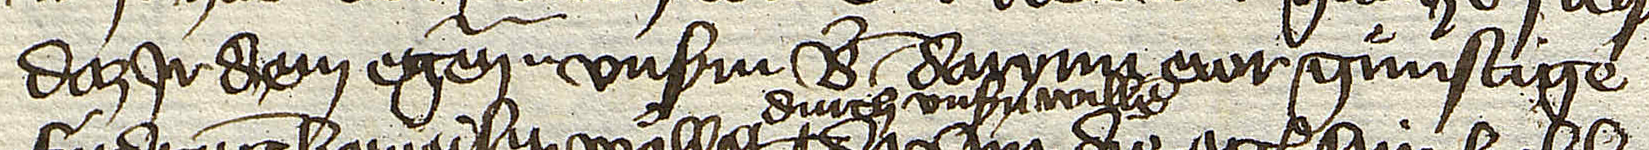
daʒ Ir dem egen* ~ vnſ*m B* / darynn ewr günſtige
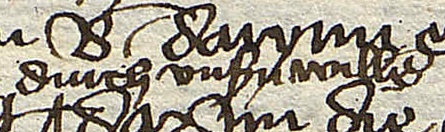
durch vnſ*n wille*
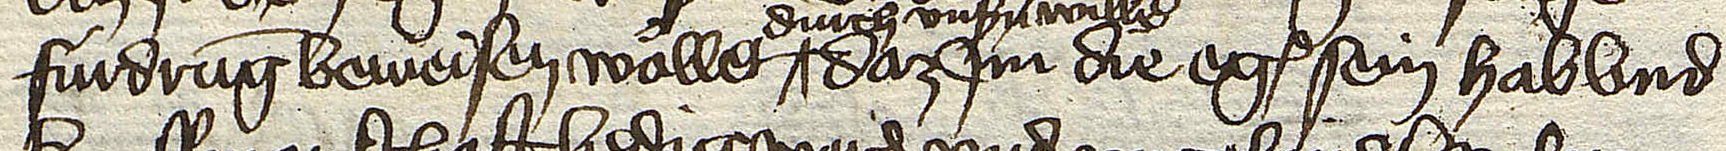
fürdru*g beweiſen wöllet daʒ Im die eg* ſein hab vnd
